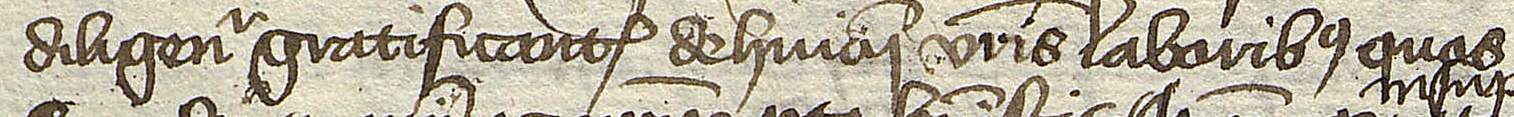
diligen* gratificant* de hui*o*i v*ris laborib* quas
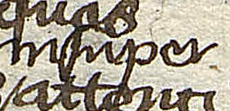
inſuper
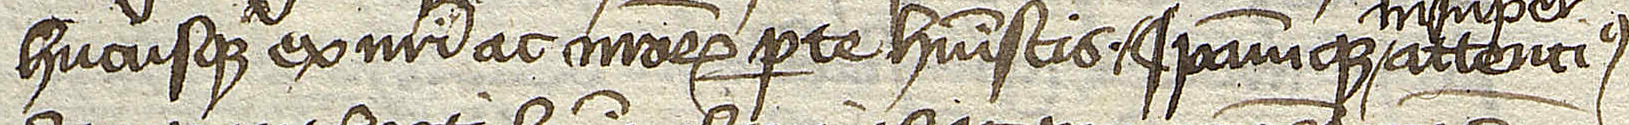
huiuſq* ex n*ri ac n*ro* p*te h*uiſtis Ip*amq* attemti*
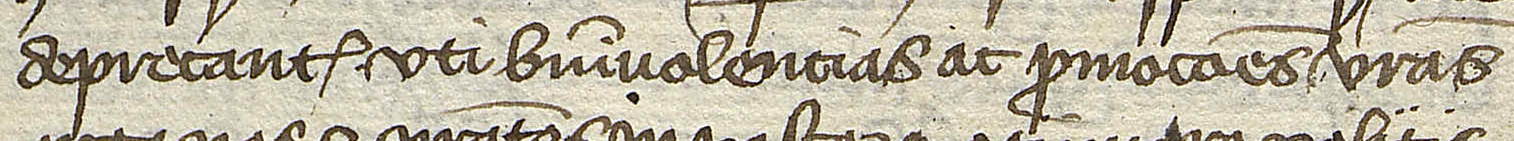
deprecant* . vti b*niuolencias ac p*moc*o*es v*ras
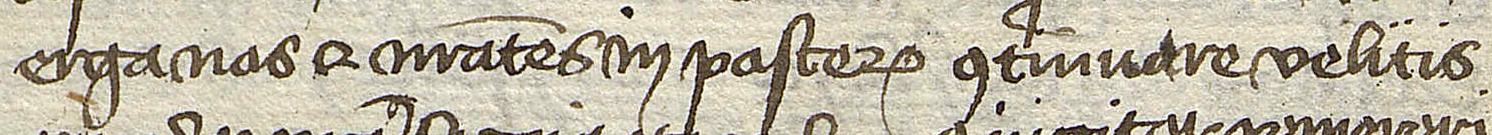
erga nos @ n*rates in poſte* *tinuare velitis
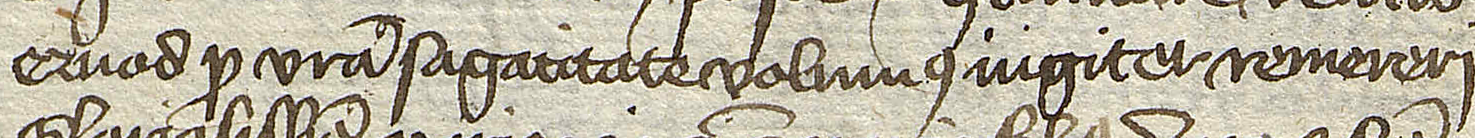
Quod p* v*ra ſagacitate volum* iugiter remereri
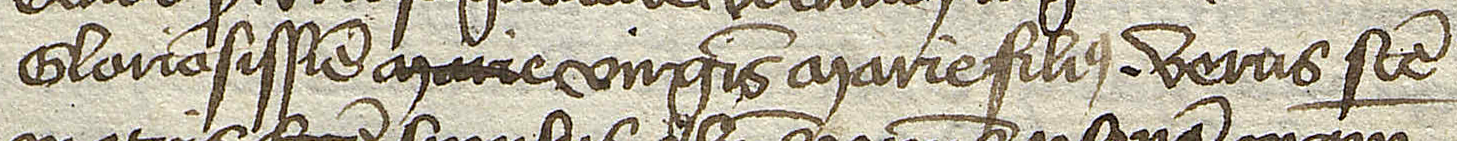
Glorioſiſſi*e Marie virgi*s Marie fili* . verus ſ*te
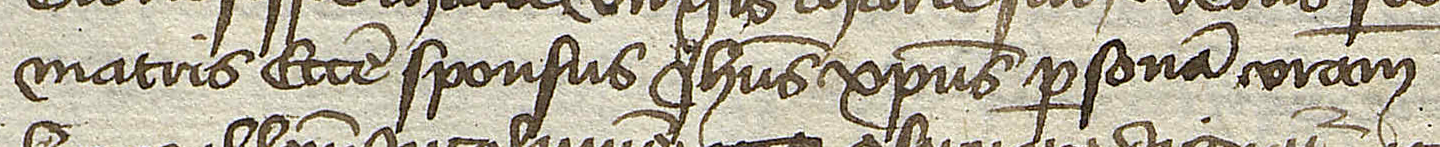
matris Ecc*e ſponſus Ih*us xpus* p*ſona* v*ram
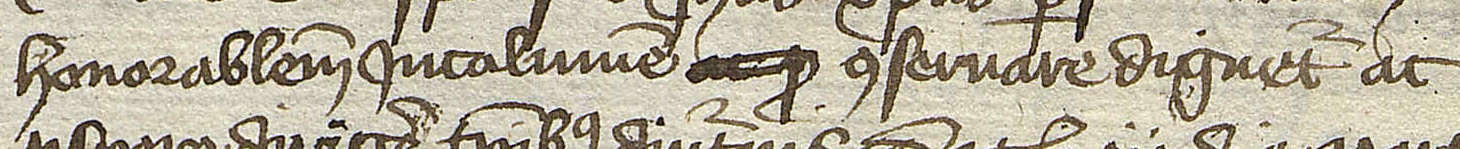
honorab*lem Incolume* ac p* *ſeruare dignet* ac
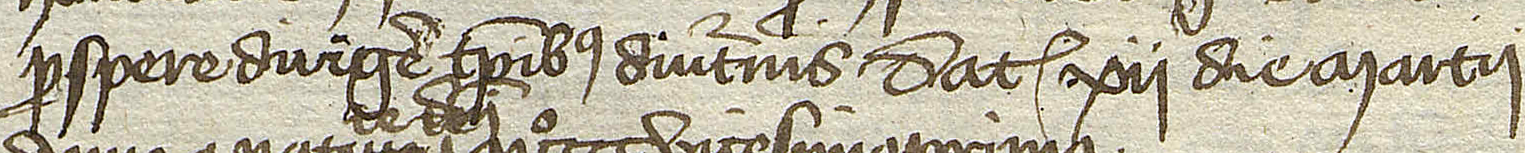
p*ſpere dirige* t*pib* diut*nis / Dat* xii die Martii
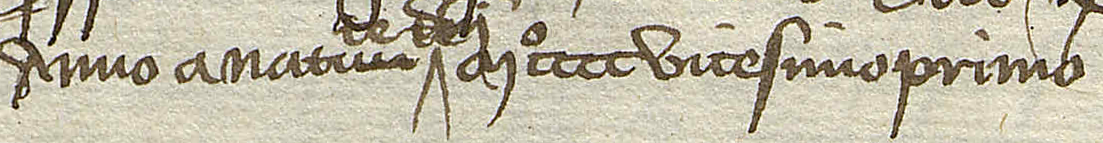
Anno a Natiui* M*cccc viceſimo primo .
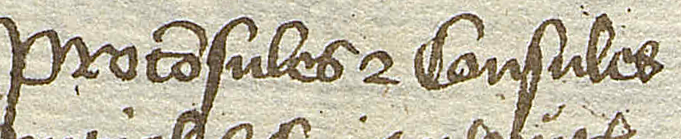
Proco*ſules @ Conſules
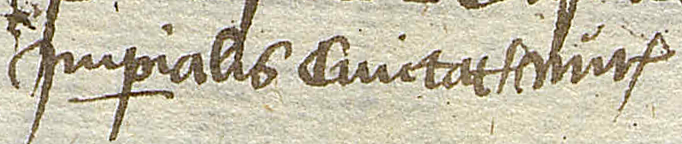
Imp*ialis Ciuitat* Nür*
